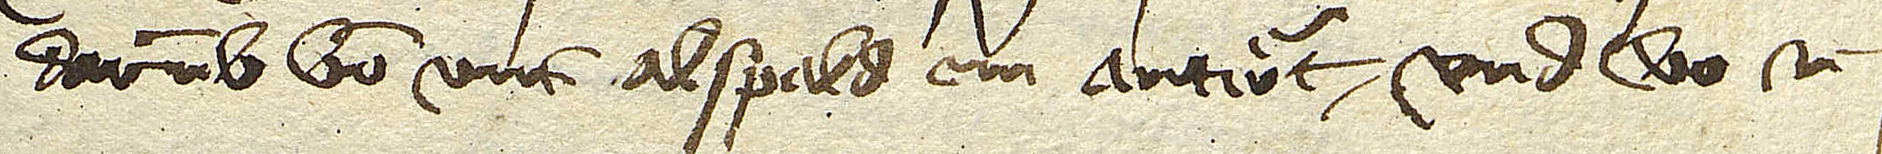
darub* vo* vns alſpald ein antwt* / vnd wo ec*
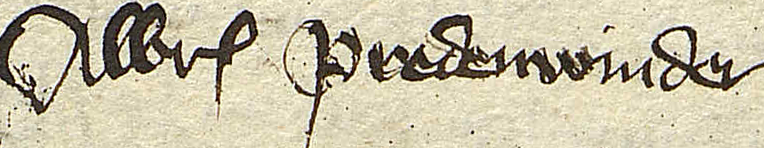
Albr* Predenwinder
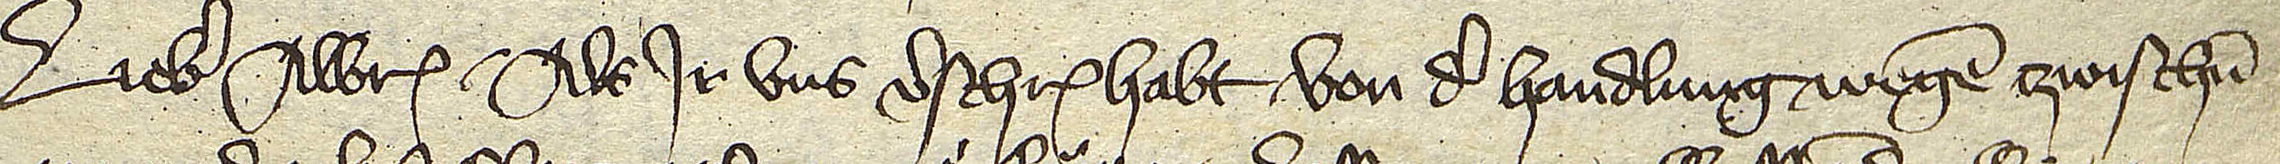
Lieb* Albr* / Als Ir vns v*ſchr* habt / von d* handlung wege* cʒwiſchn*
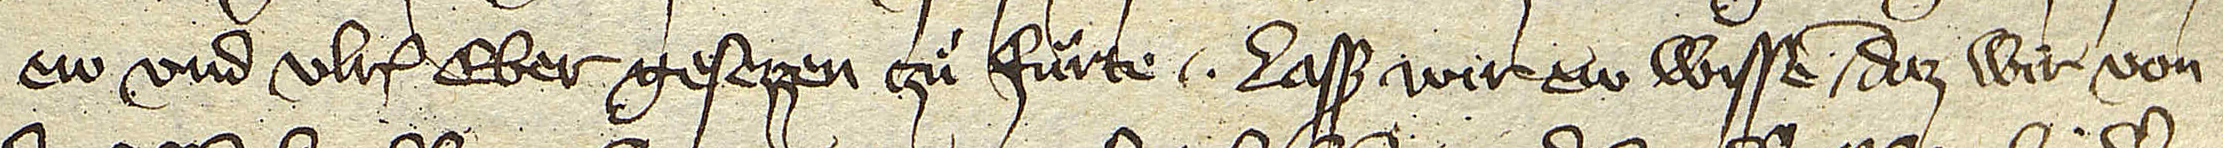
ew vnd vlr* Eber geſeʒʒen cʒü Fürte / . Laſſ* wir ew wiſſe* / daʒ wir von
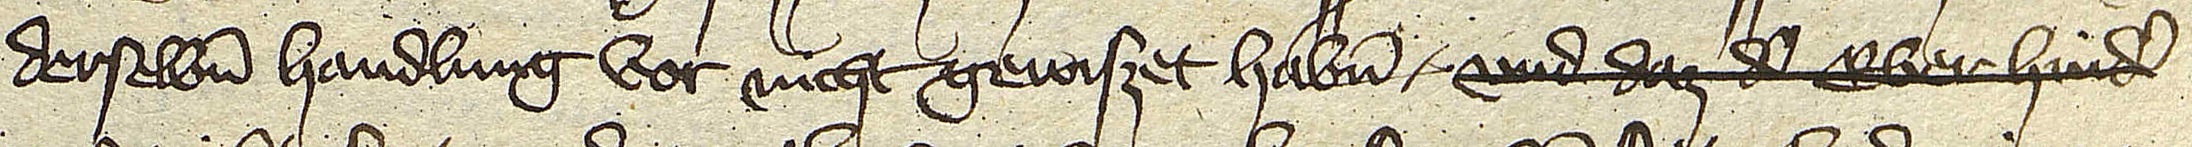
derſelbn* handlung vor nicht gewiſʒet habn* / vnd daʒ d* Eber hind*
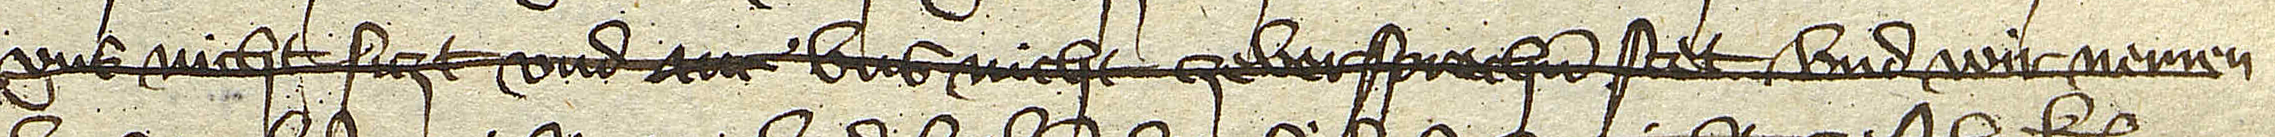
vns nicht ſicʒt vnd auc vns nicht cʒevorſprechn* ſtet / vnd wir nemen
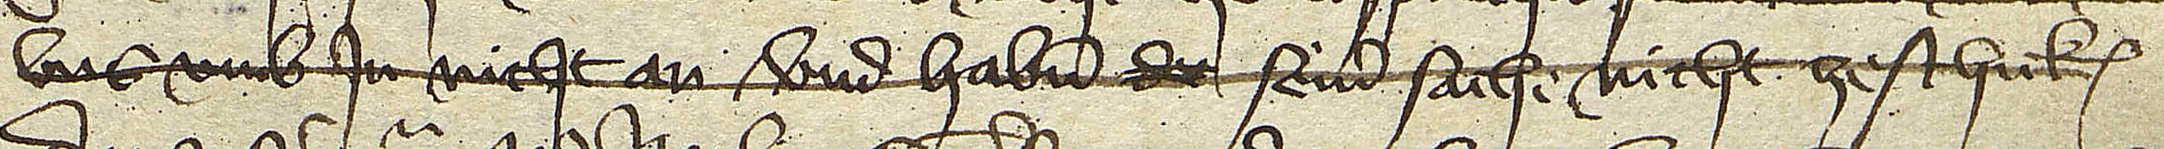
vns vmb In nicht an / vnd habn* der ſein* ſache nciht cʒeſchick*
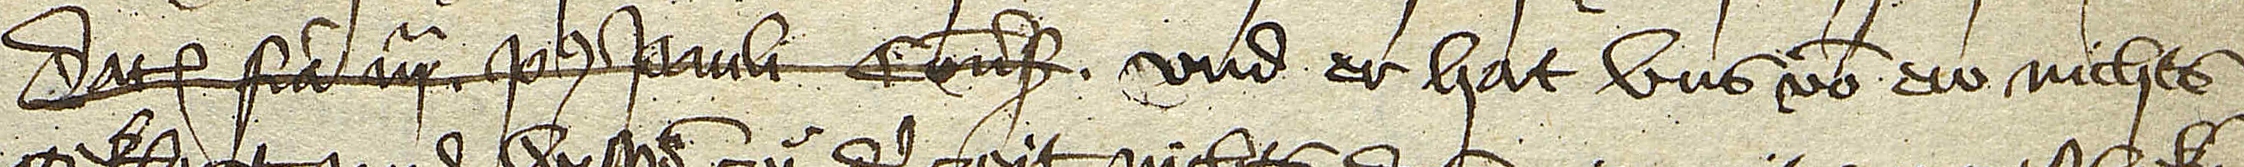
Dat* fia* iii* . p* Pauli Cou*ſ* . vnd er hat vns vo* ew nichts
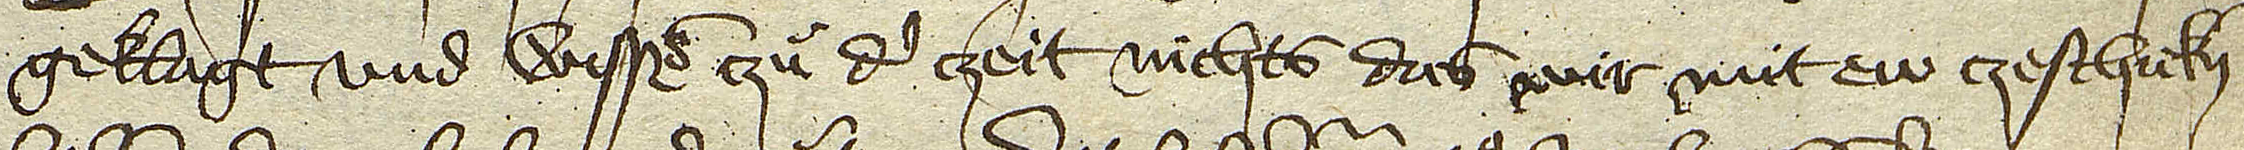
geklagt vnd wiſſe* cʒü d* cʒeit nichts das wir mit ew cʒeſchickn*
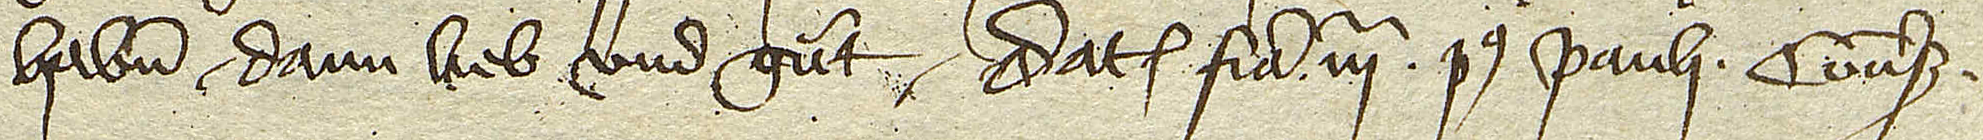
habn* / dann lieb vnd güt / Dat* fia* iii* . p* Pauli . Cou*ſ*.
